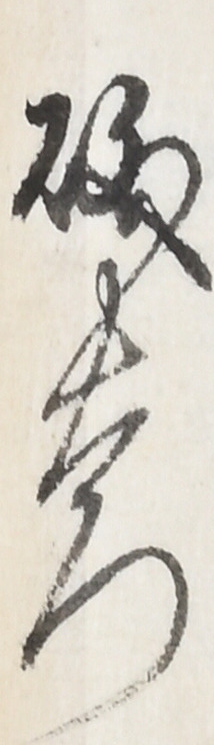磯右衛門
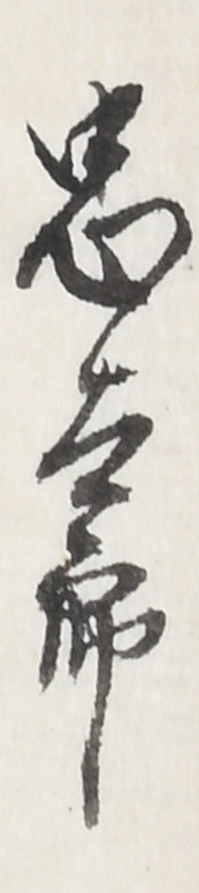忠太郎
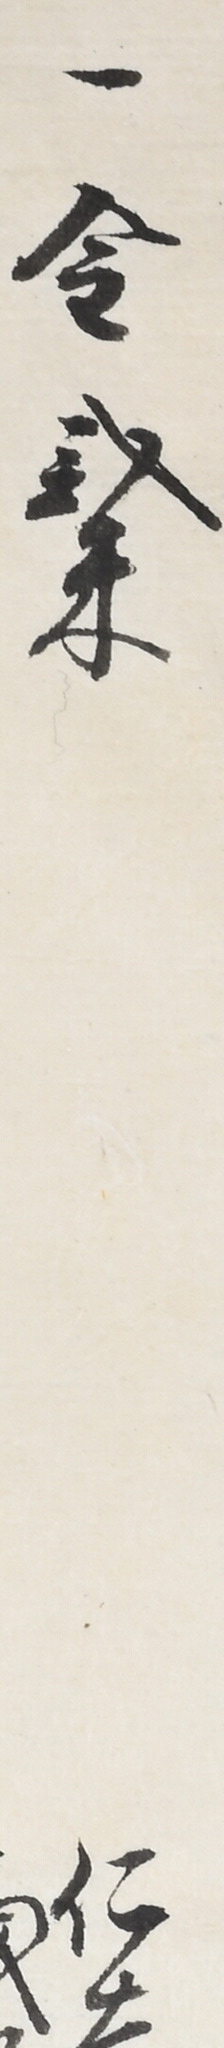一金弐朱伴蔵
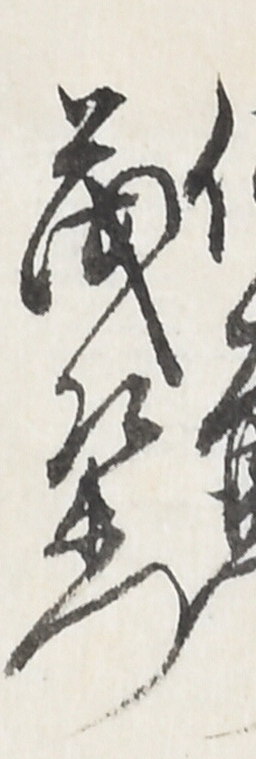茂左衛門
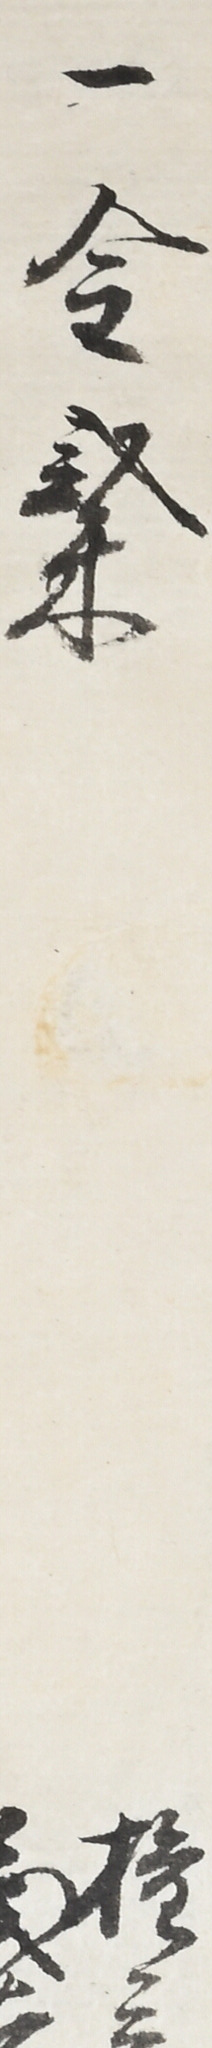一金弐朱権兵衛
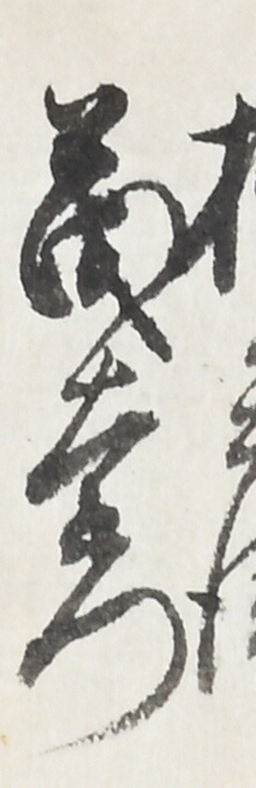茂右衛門
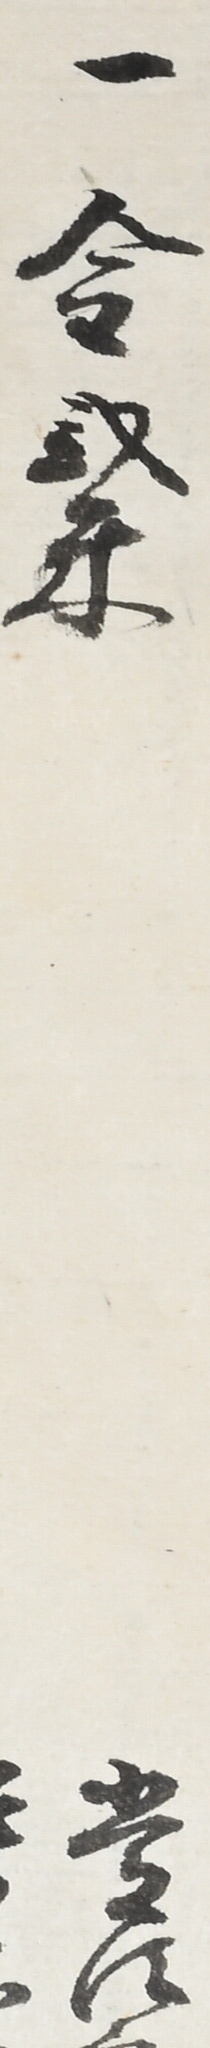一金弐朱伴蔵
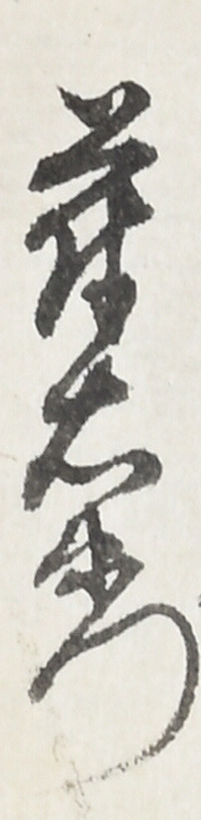茂右衛門
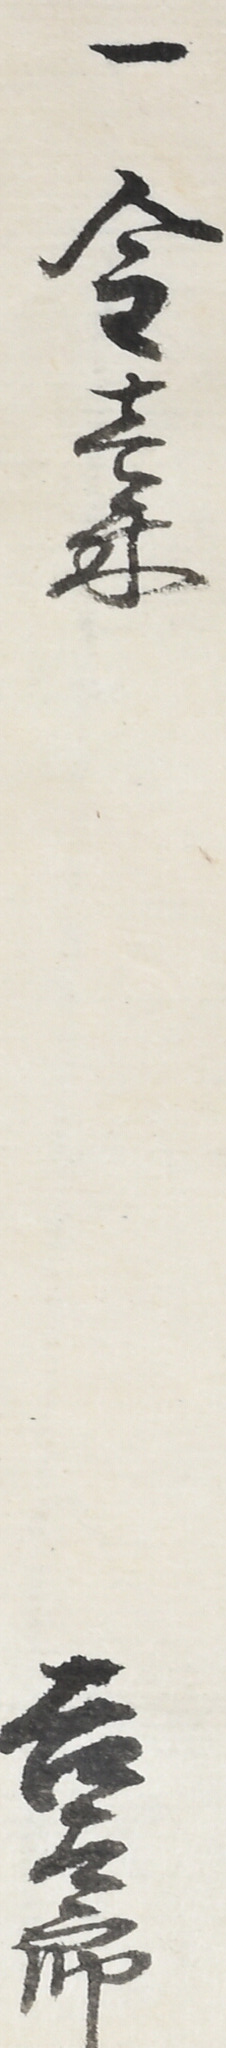一金壱朱吉太郎
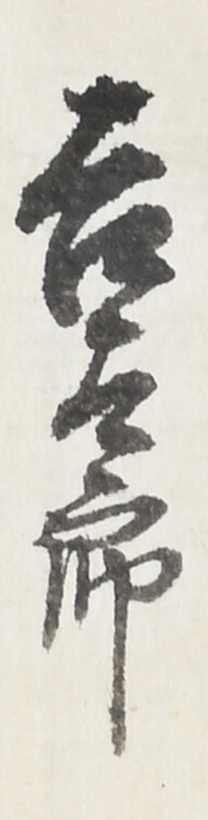忠太郎

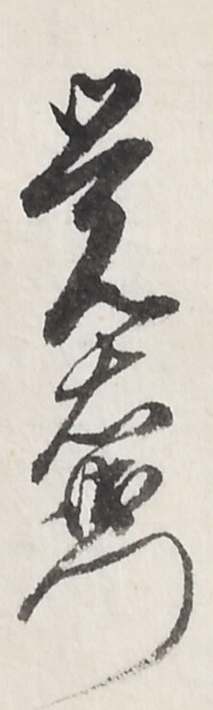冨右衛門
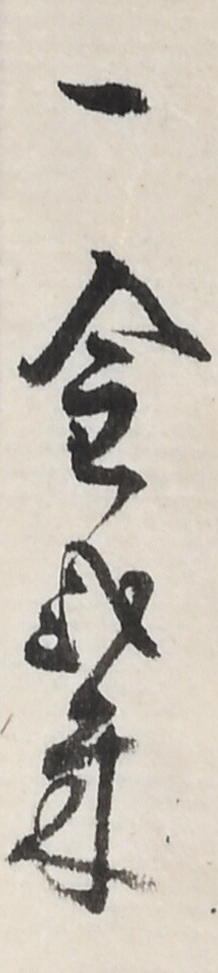一金弐朱友吉
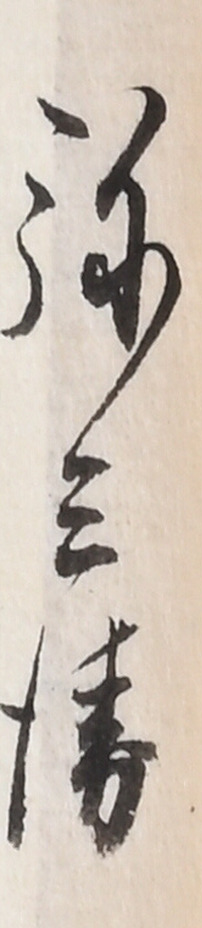弥兵衛
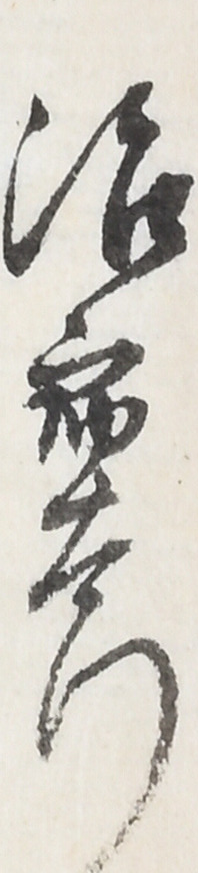治郎右衛門
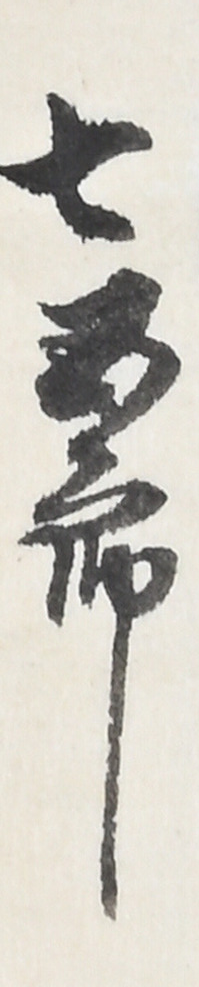七五郎
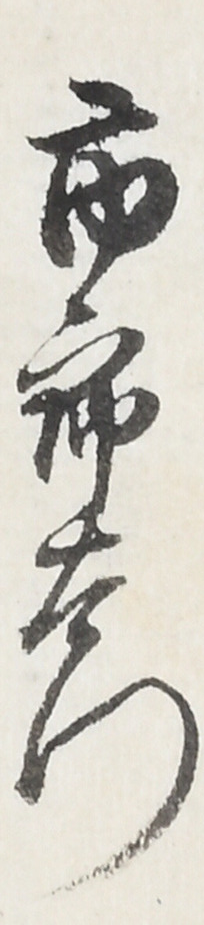市郎右衛門
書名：御拝地百五拾年御祝儀献上御目録名前
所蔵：伊那市立高遠町図書館・合同会社AMANE
